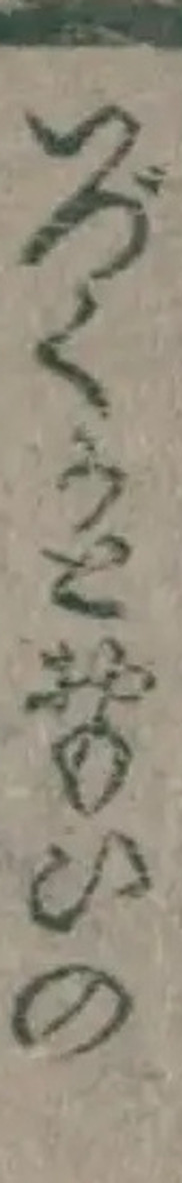いづくかとおもひの
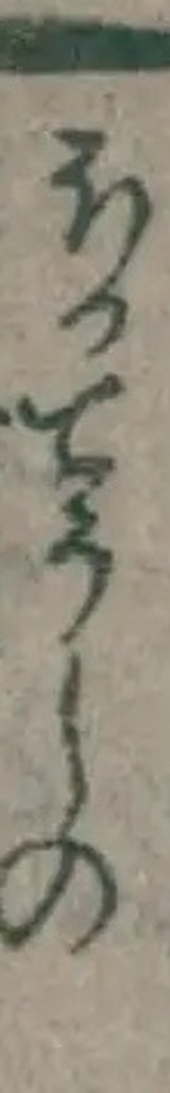ほかてうしの
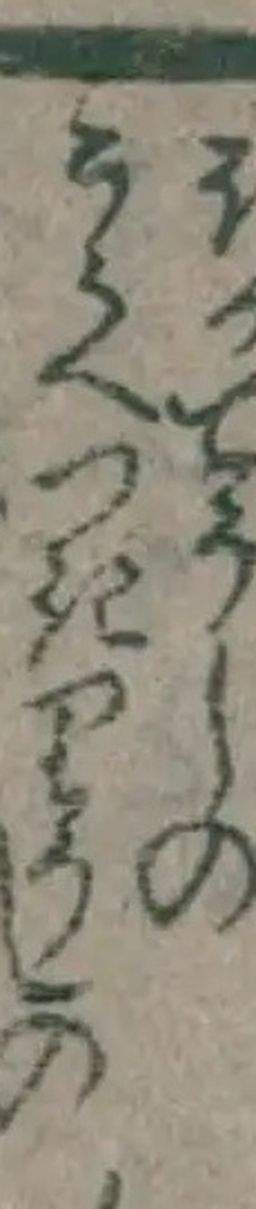うらへつきりうしの
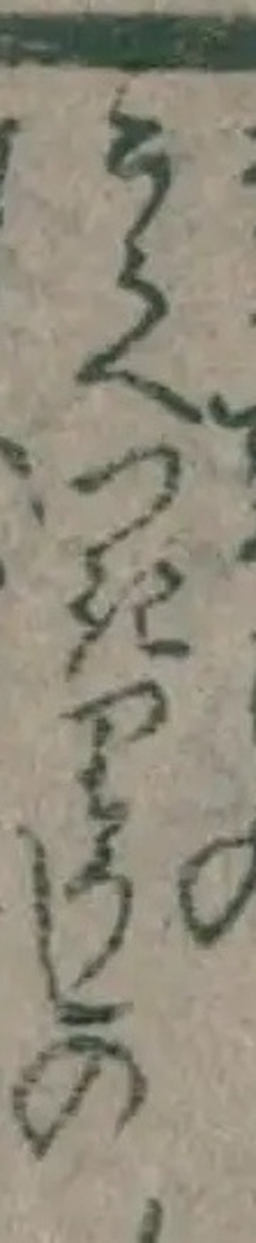うらへつきりうしの
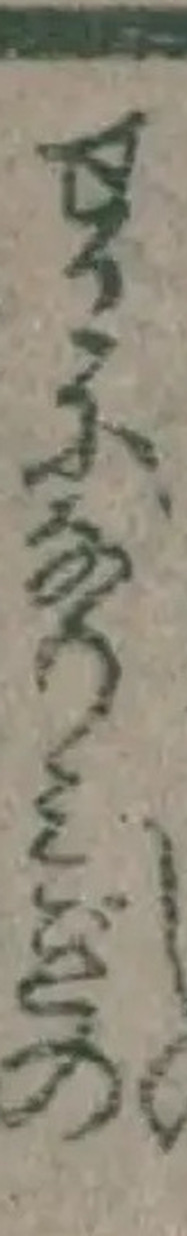せわになりみぎの
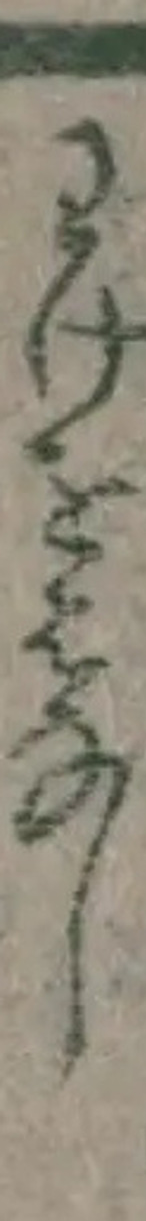わけをはなし
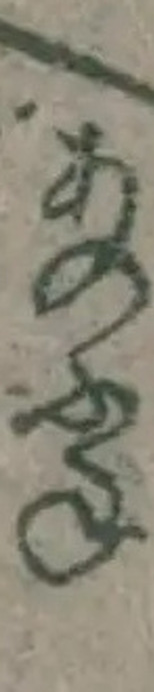あのふね
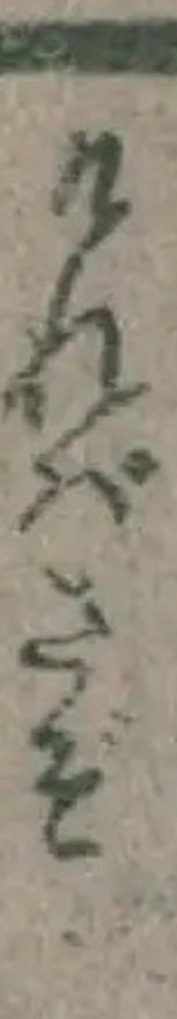ければさぞ
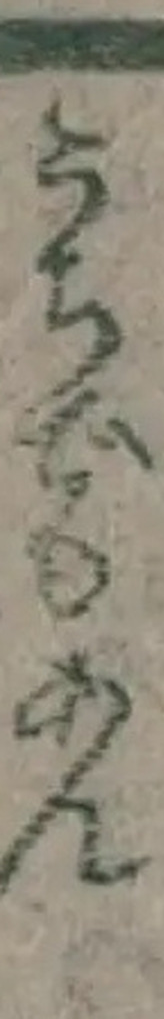うちでもあん
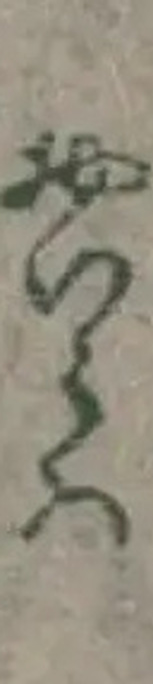おいらは
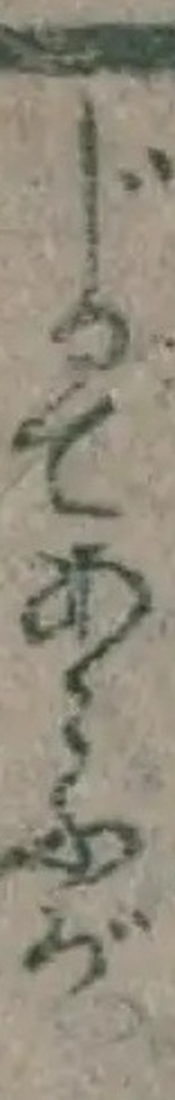じるてあらふが
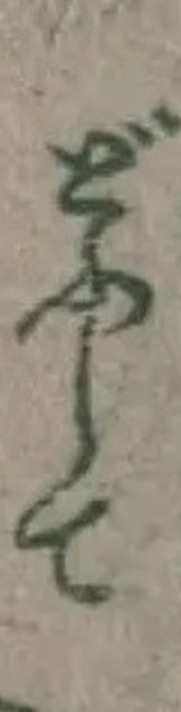どふして
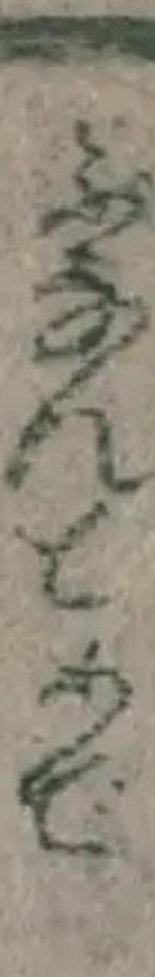ぶなんとめで
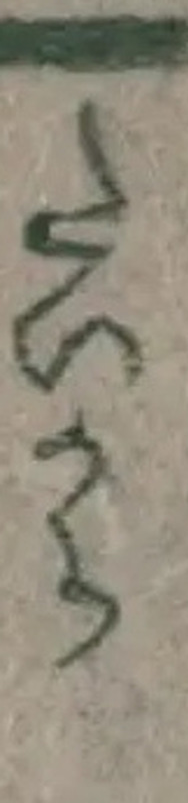たいから
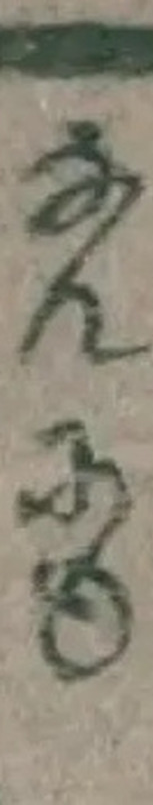なんにも
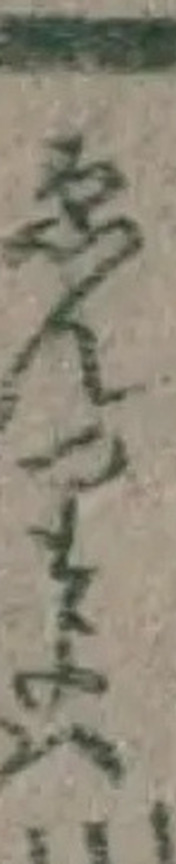ゑんりょは
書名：縦筒放唐の噺 3巻
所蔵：国立国会図書館 National Diet Library, JAPAN
